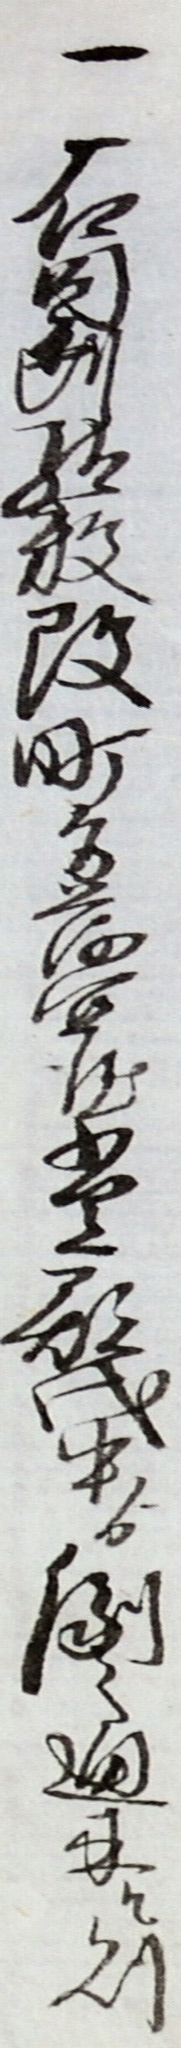一右同断駄数改町方宜座郡代中より例之通来ル則
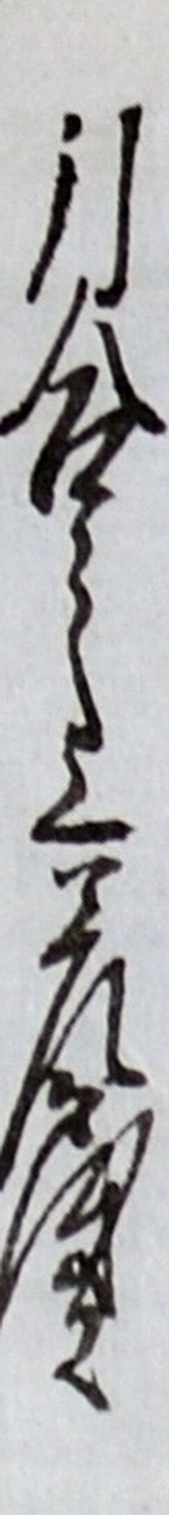引合之上差戻候
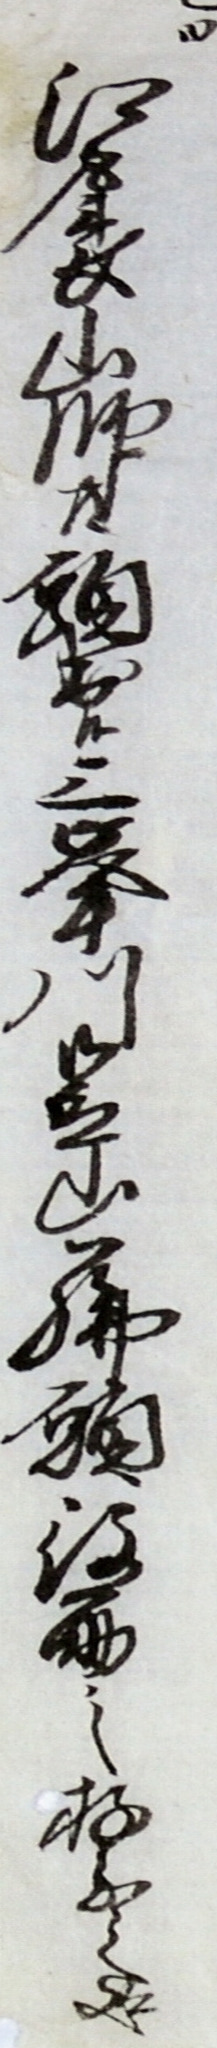一江戸表山師は願出候三峯川御立山願役筋之之処

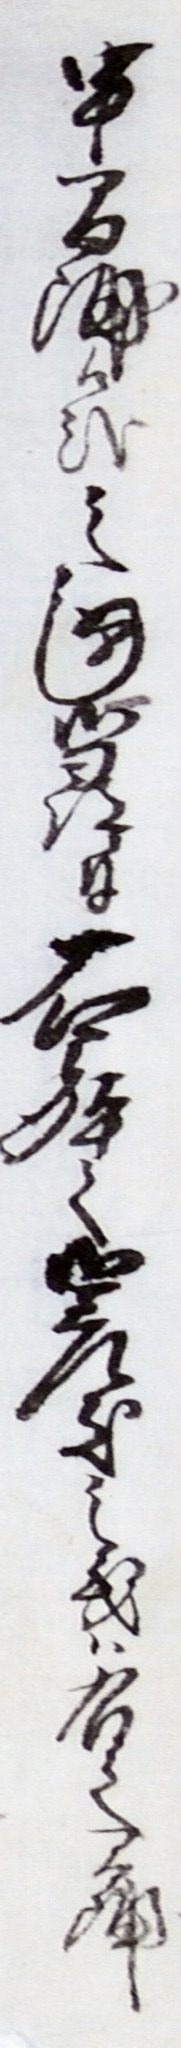申間敷候哉之趣御尋候ニ付右躰之御差支之義ハ有之間鋪
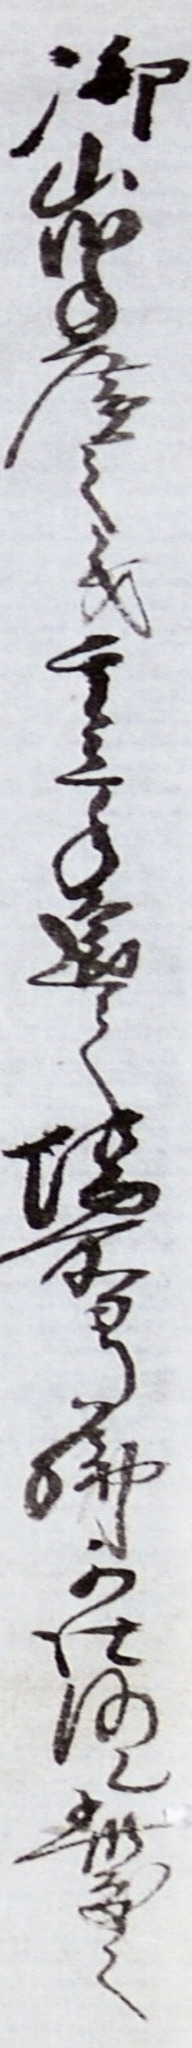御山御手広之義其上手遠之場所ヨリ御払可仕何レ此度之
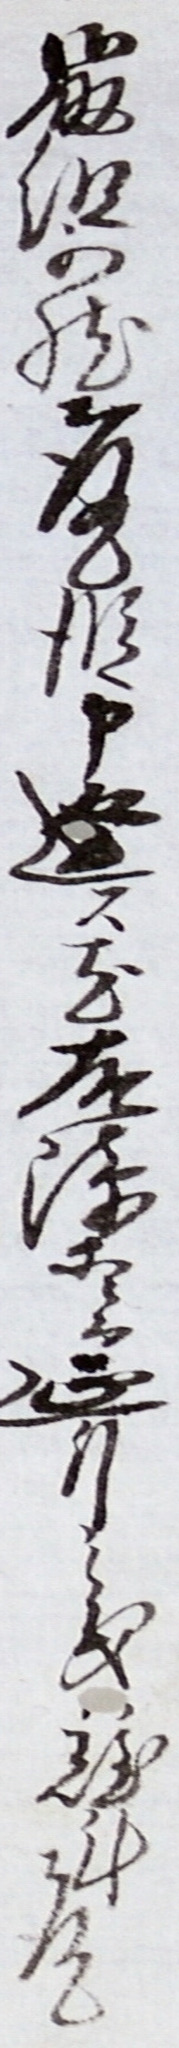御取組可然奉存候段申達ス尤故障等ニ而延引之義は難斗奉存候
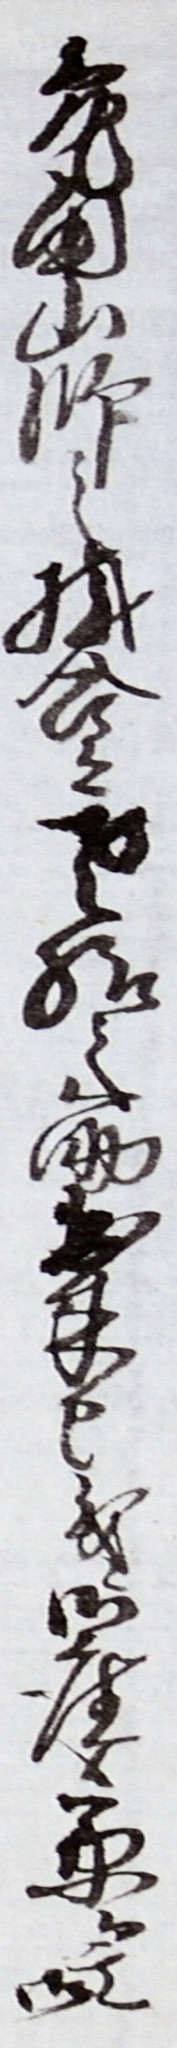兎角山師之掛合は左様之筋出来申候義ニ御座候兼而其御
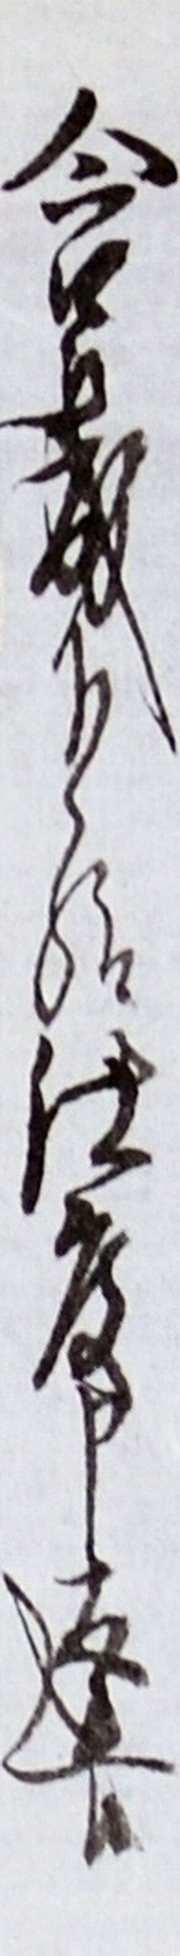含被成下候様ニ仕度申達候
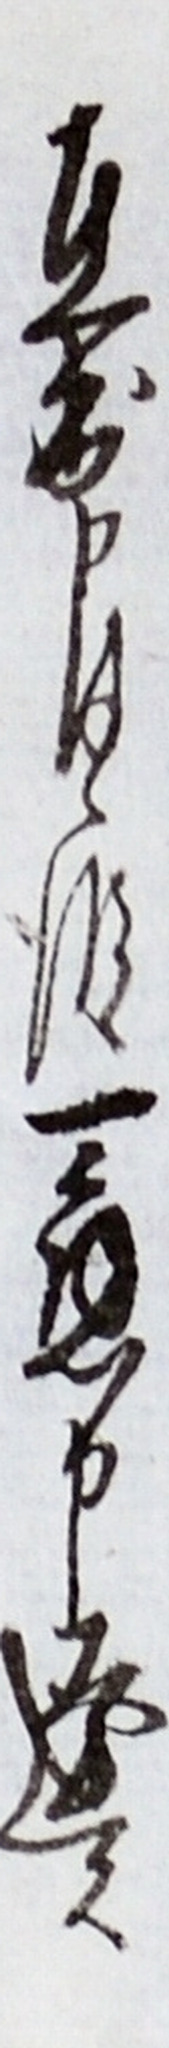在出申付候段一応申達ス
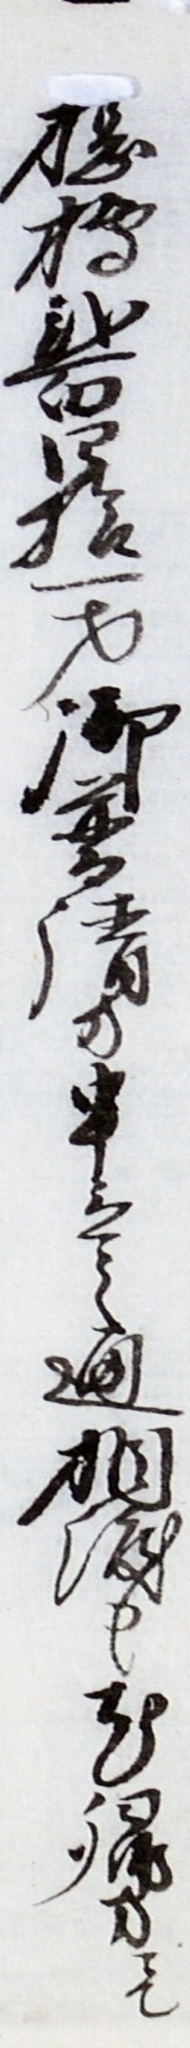一椹榑＃１弐百四拾一才御普請方申立之通相渡申尤郷方ニて
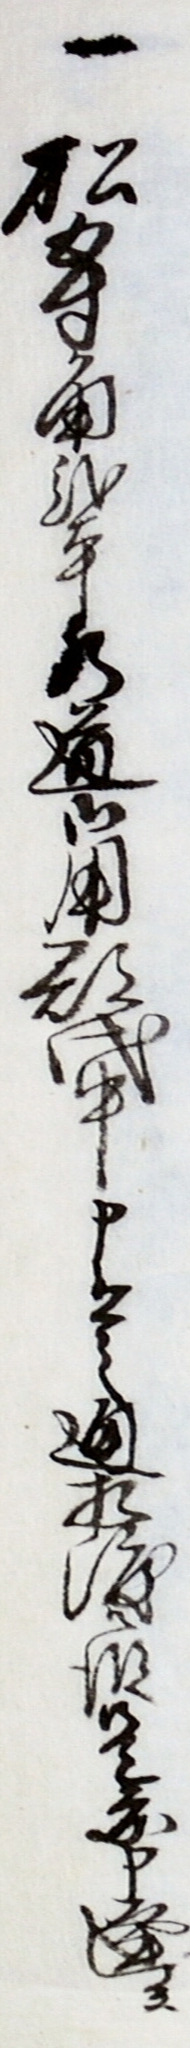一松五寸角弐本水道御用郡代中申立之通相渡候段是亦申達ス
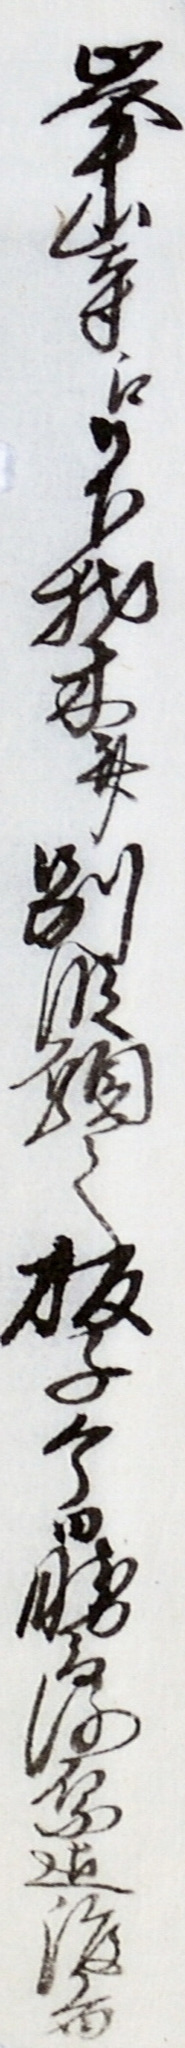一峯山寺江被下材木并別段願之板子今日勝間河原迄渡方
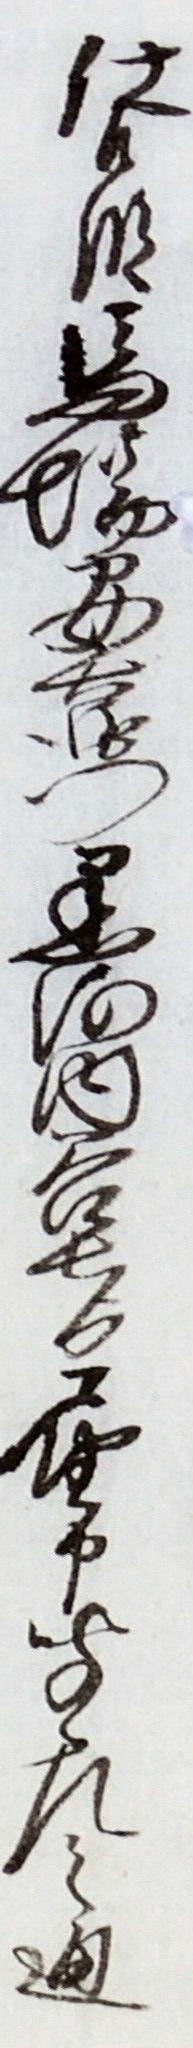仕候段馬場安右衛門黒河内善右衛門届申聞左之通
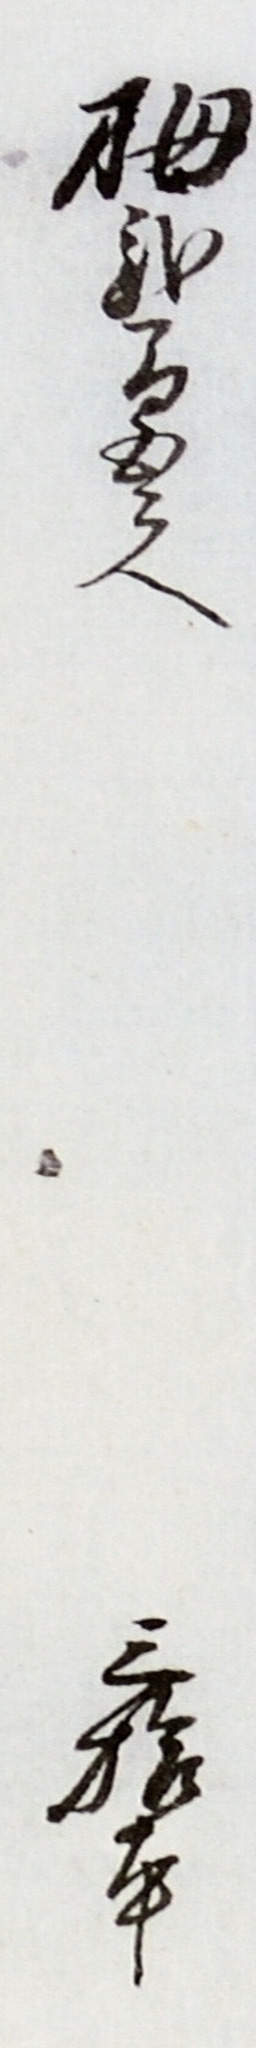栂弐間五尺三拾本
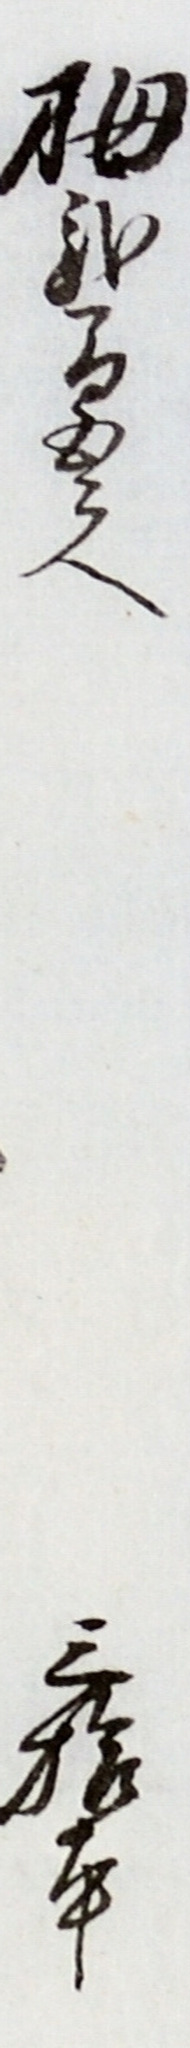栂弐間五尺三拾本
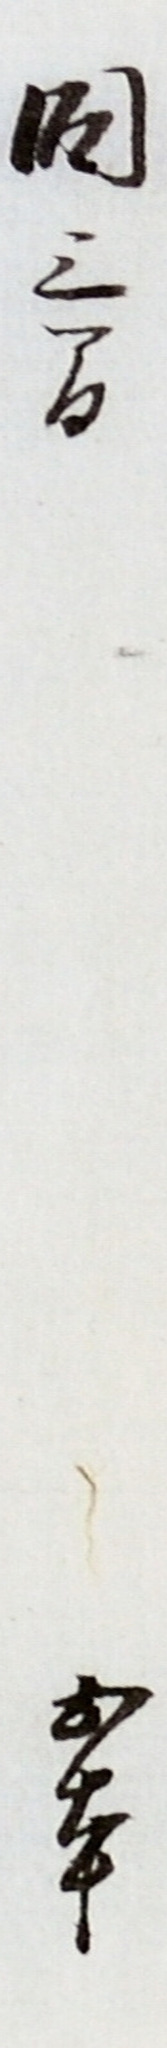同三間五本
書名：御山奉行御用控
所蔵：伊那市立高遠町図書館・合同会社AMANE
